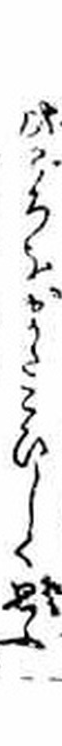此ごろをかうたこひしく思ふ
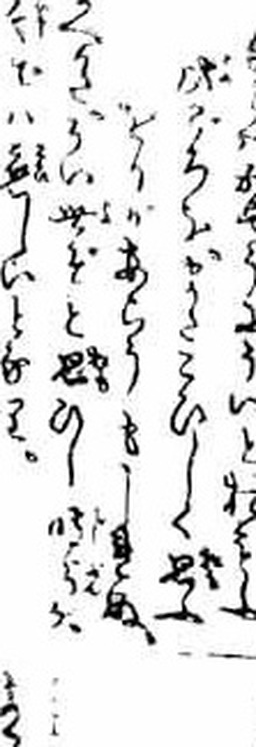をりがあらうもし見ぬ
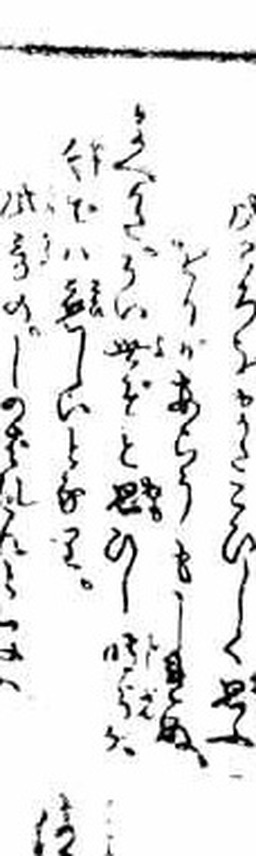まへかたうい世ぞと思ひし時分が
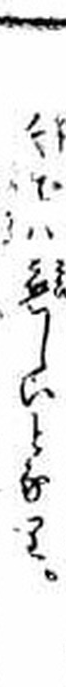今では恋しいとなり清
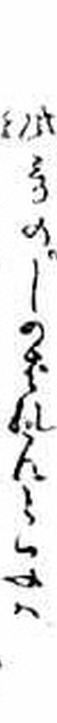此哥のしのばれんといふは輔
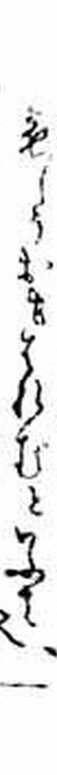恋しうおもはれむといふ事也
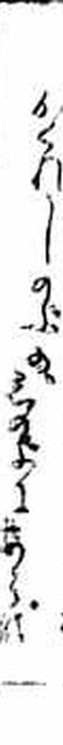かくれしのぶのしのぶにあらず朝臣

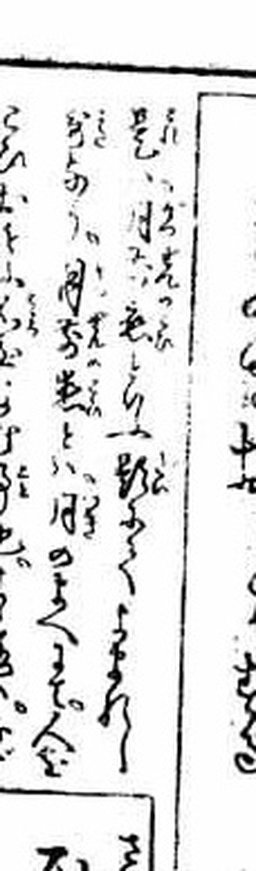是は月前恋といふ題にてよまれし
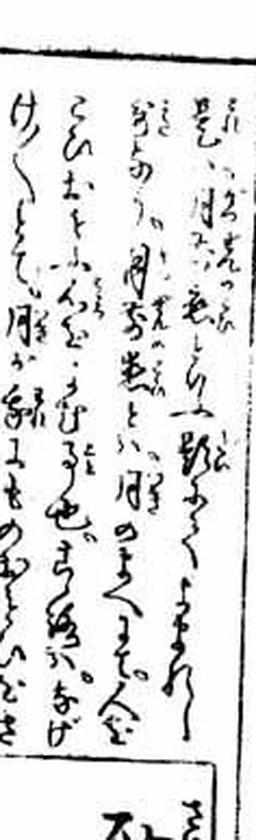哥なり月前恋とは月のまへにて人を西
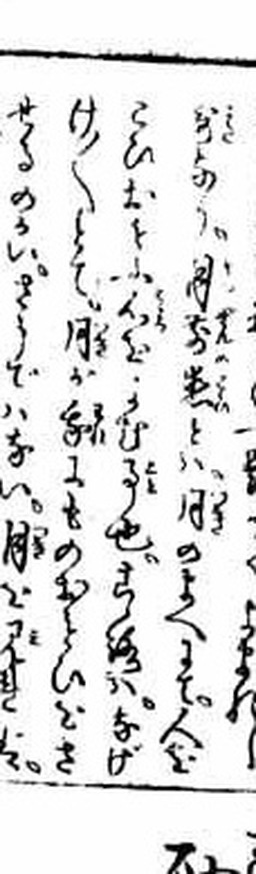こひおもふ心をよむ事也これはなげ行
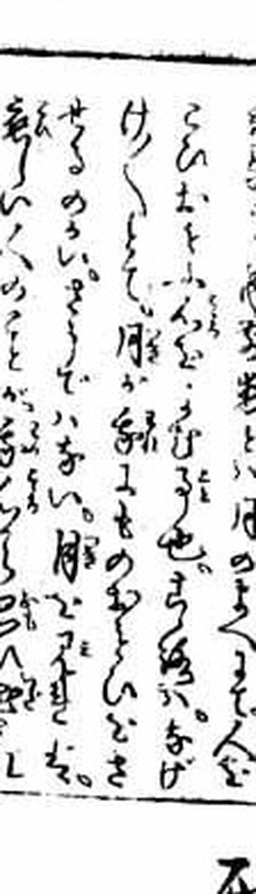け〳〵とて月が我にものものおもひをさ
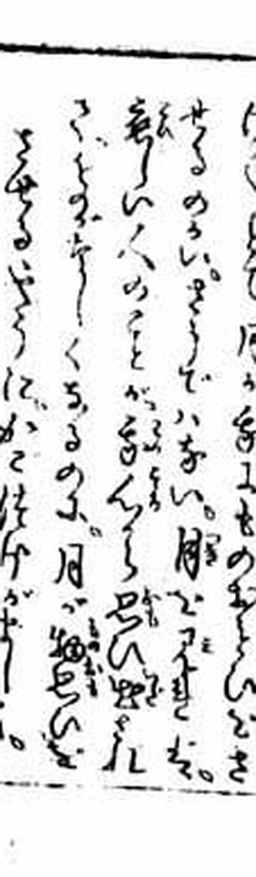恋しい人のことが我心より思ひ出すされ
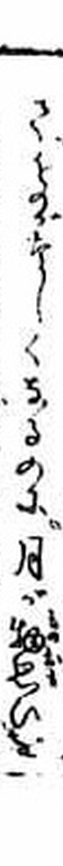てものがなしくなるのに月が物思ひを
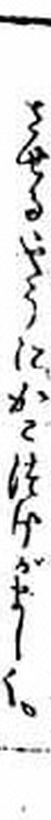させるやうにかこつけがましく法
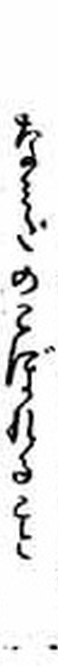なみだのこぼれること
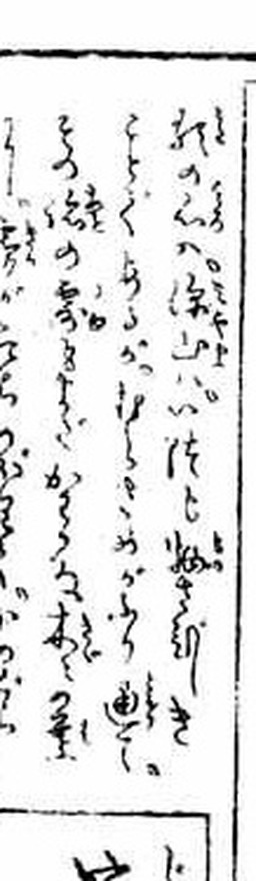ことであるがむらさめがふり通て寂
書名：小倉百人一首
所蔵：東京学芸大学教育コンテンツアーカイブ
